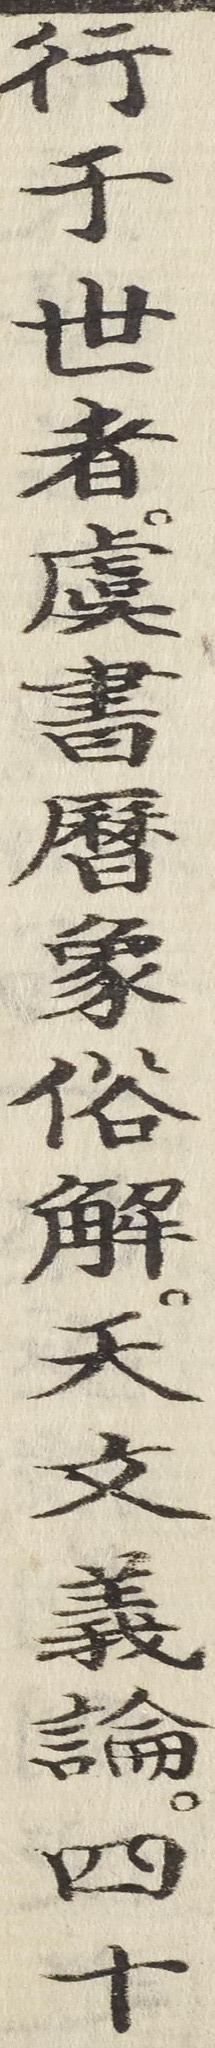行于世者。虞書暦象俗解。天文義論。四十
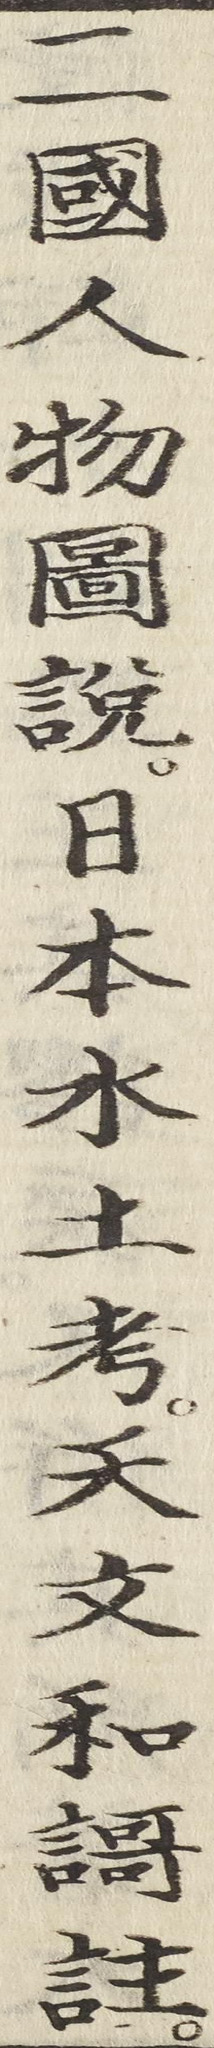二国人物図説。日本水土考。天文和歌註。
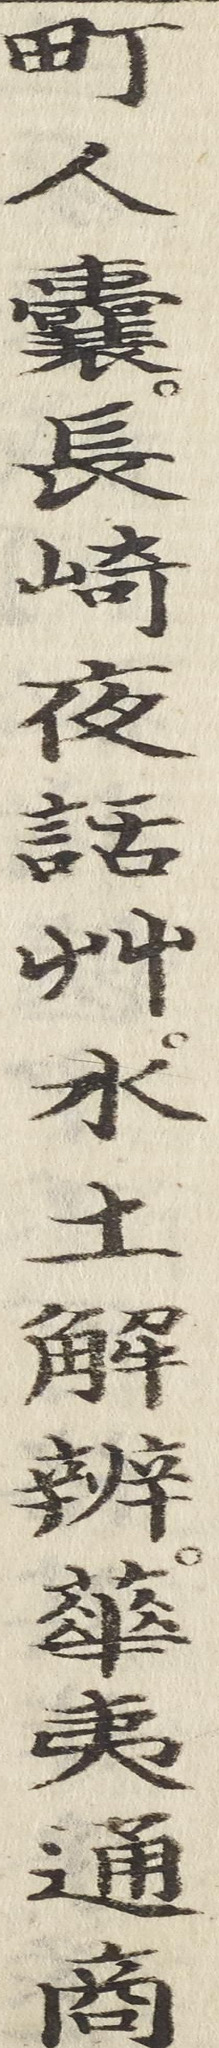町人囊。長崎夜話草。水土解辨。華夷通商
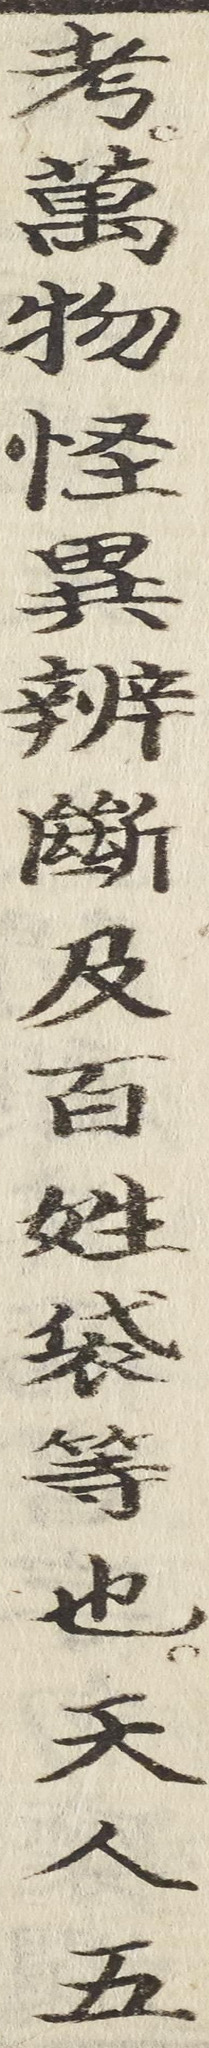考。万物怪異辨断及百姓袋等也。天人五
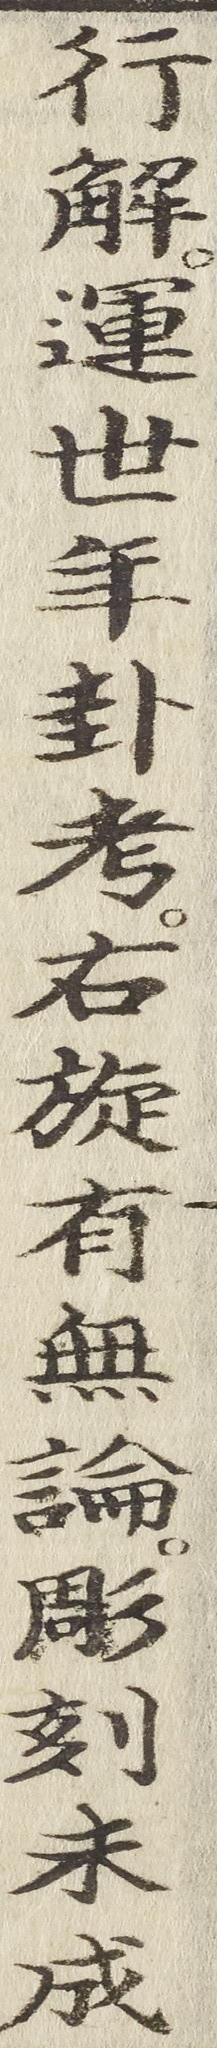行解。運世年卦考。右旋有無論。彫刻未成
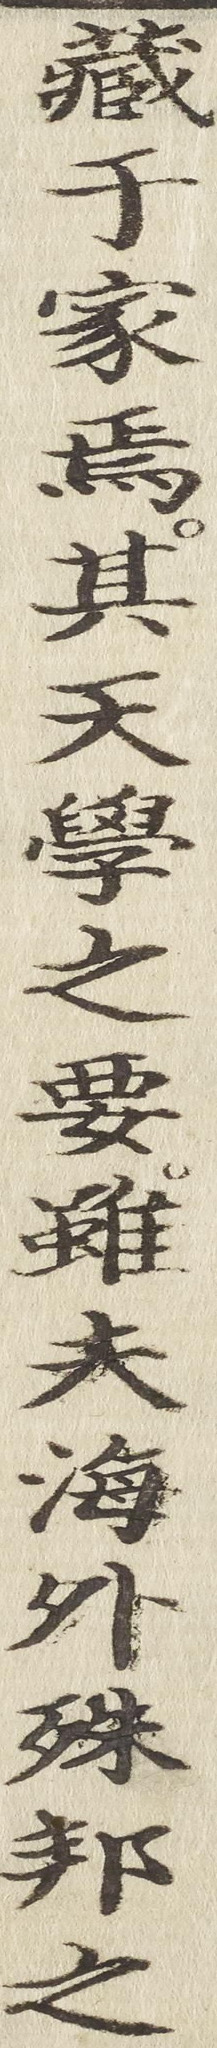蔵于家焉。其天学之要。雖夫海外殊邦之
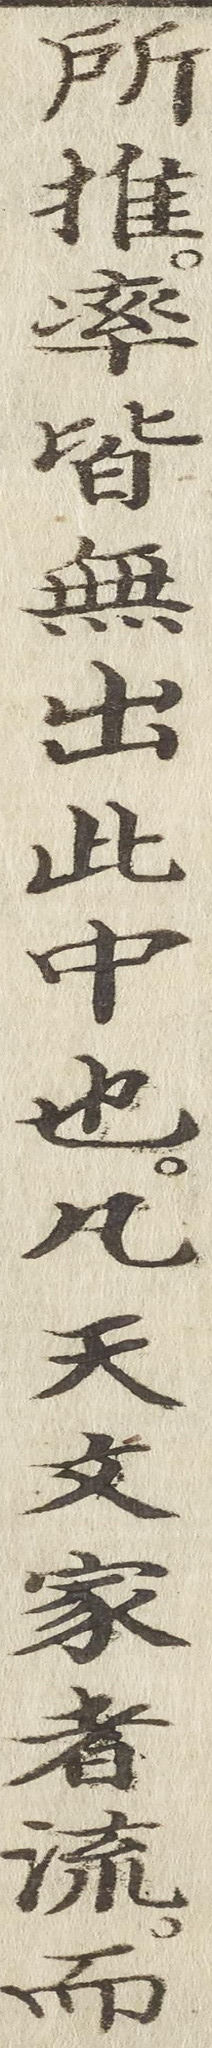所推。率皆無出此中也。凡天文家者流。而
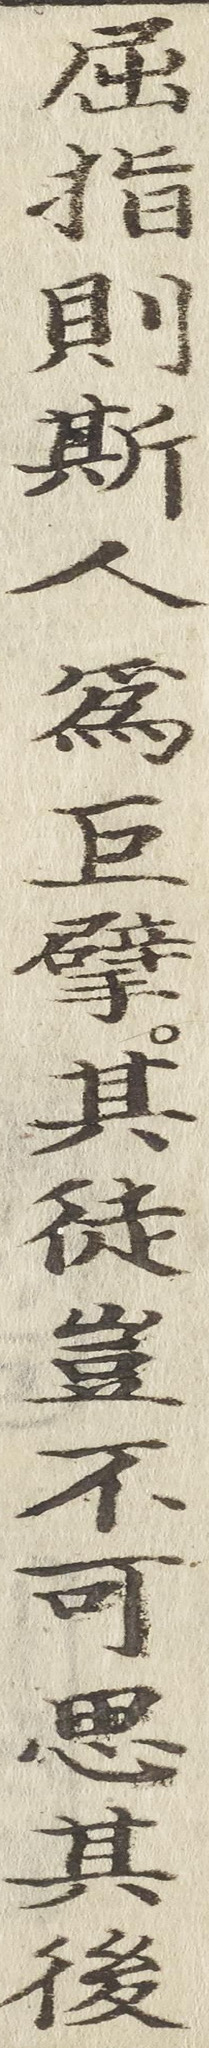屈指則斯人為巨擘。其徒豈不可思其後
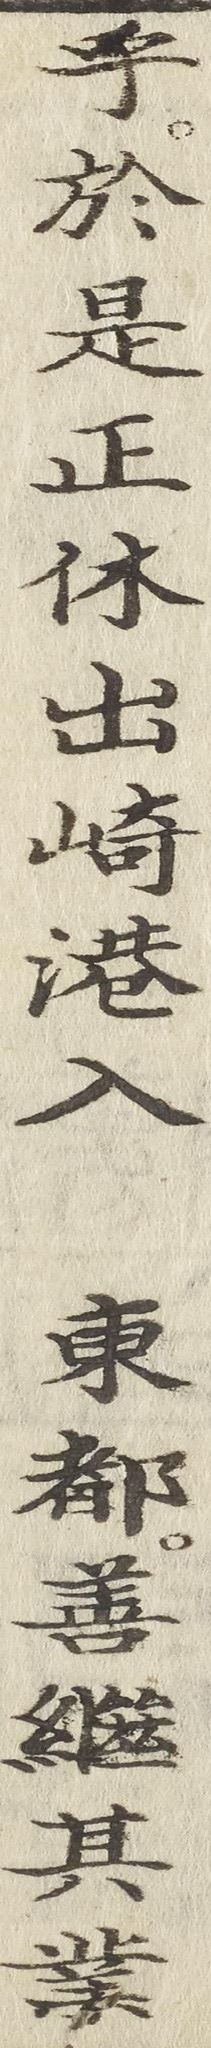乎。於是正休出崎港入東都。善継其業
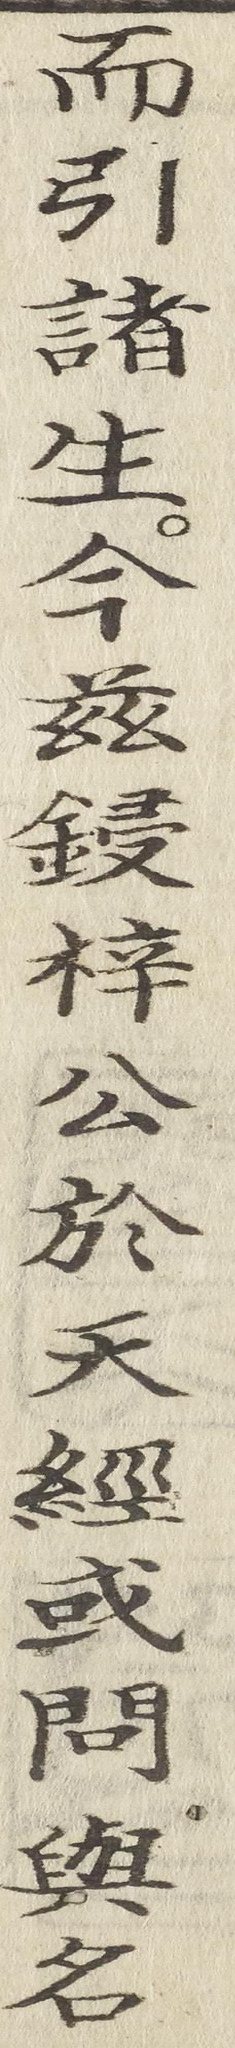而引諸生。今玆鋟梓公於天経或問。与名
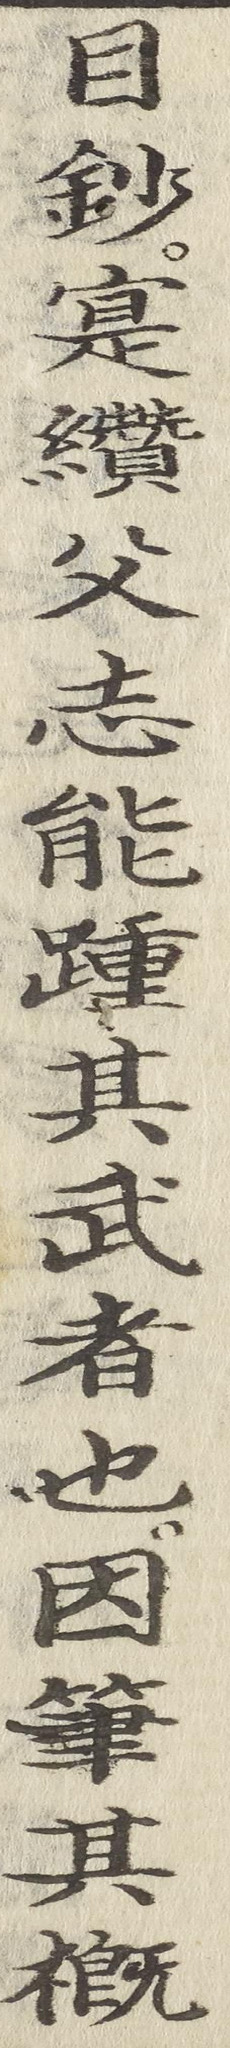目鈔。寔纉父志能踵其武者也。因筆其概
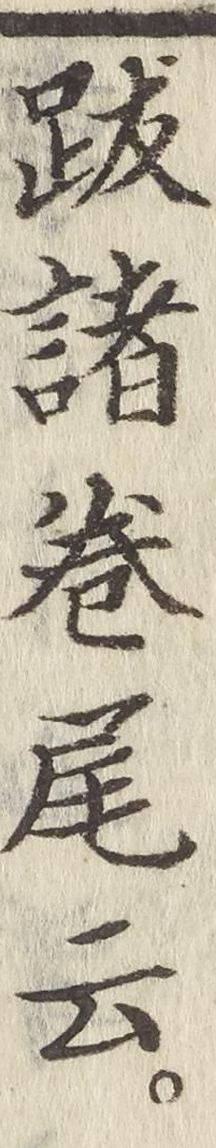跋諸巻尾云。

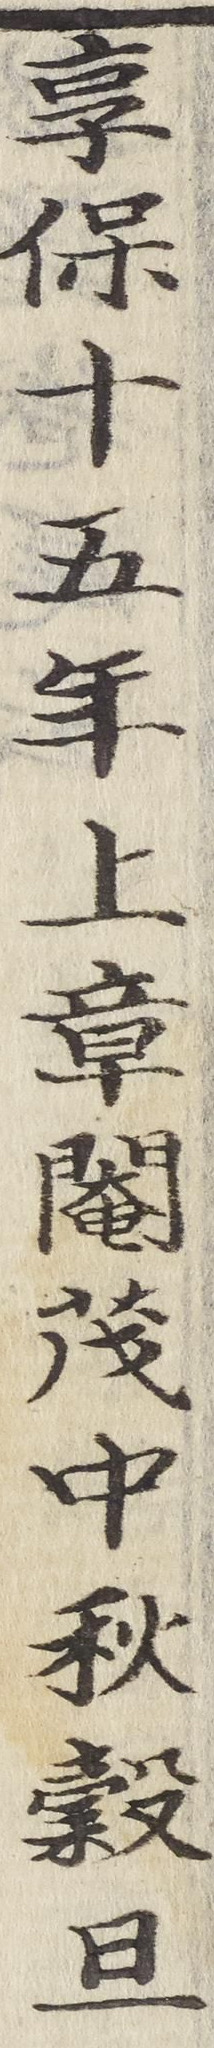享保十五年上章閹茂中秋穀旦
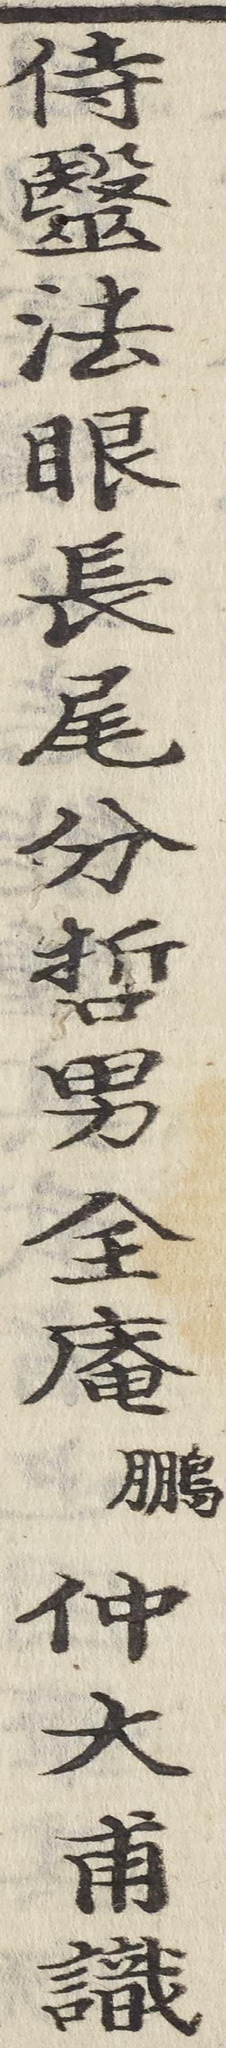侍医法眼長尾分哲男全庵鵬仲大甫識
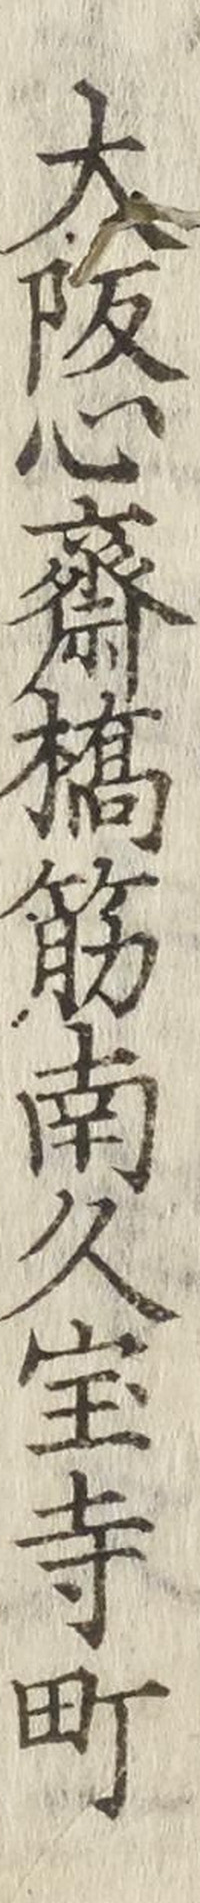大阪心斎橋筋南久宝寺町
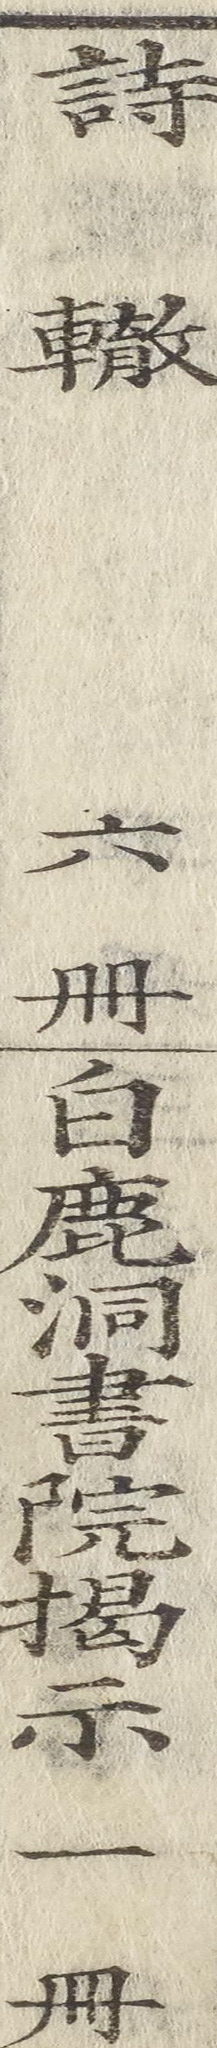詩轍六冊白鹿洞書院掲示一冊
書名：天經或問　地
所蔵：東京大学地震研究所図書室 Earthquake Research Institute Library, The University of Tokyo, JAPAN
